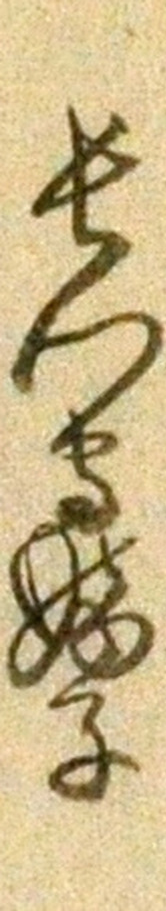長門守嫡子
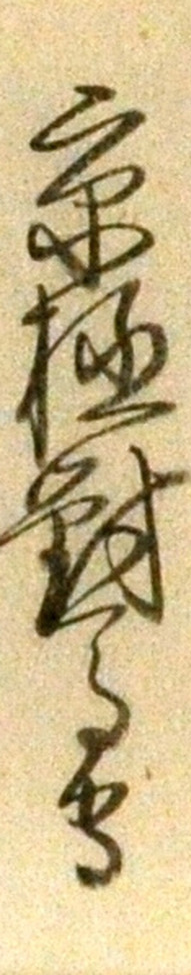京極対馬守
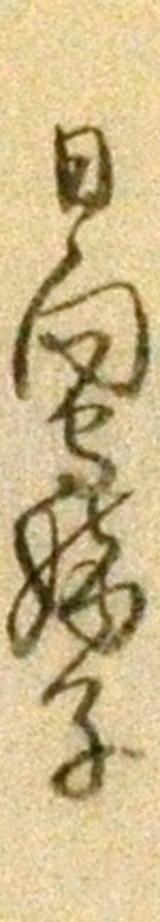日向守嫡子
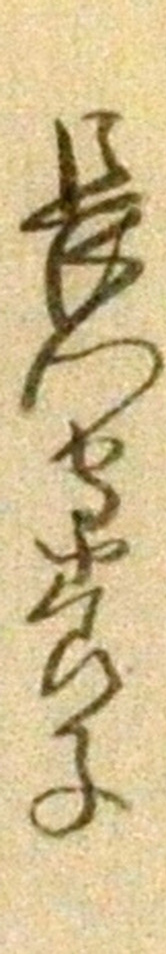長門守養子
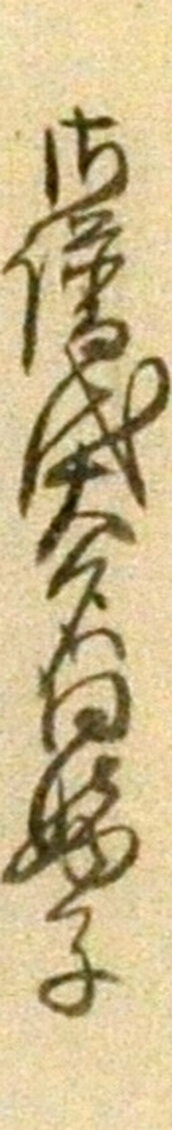御譜代大名同嫡子
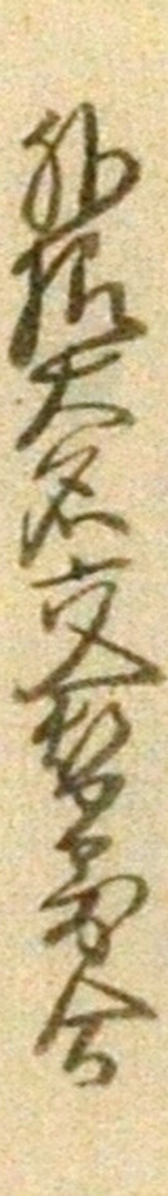外様大名交替寄合
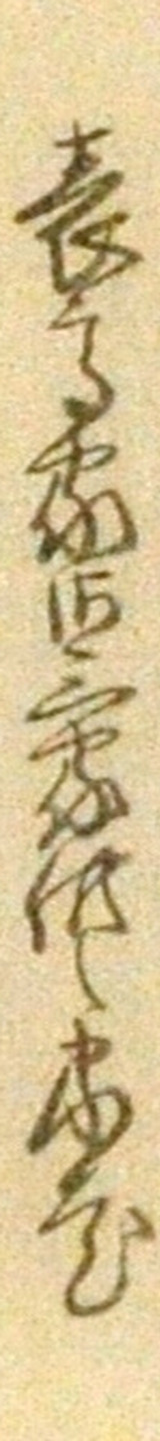表高家御三家供之家老
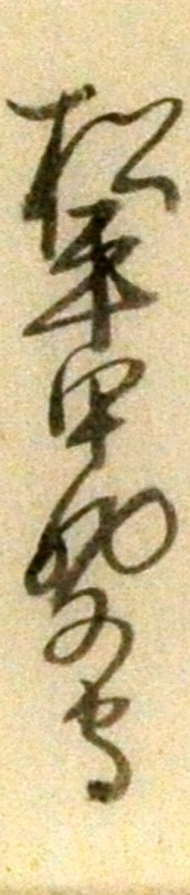松平甲斐守

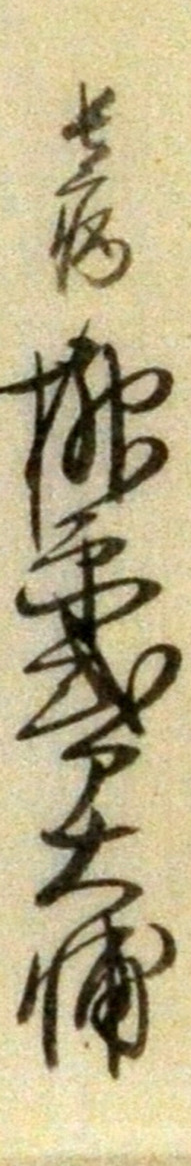長病柳原式部大輔
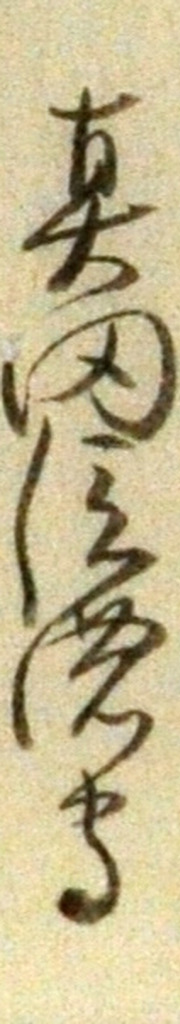真田信濃守
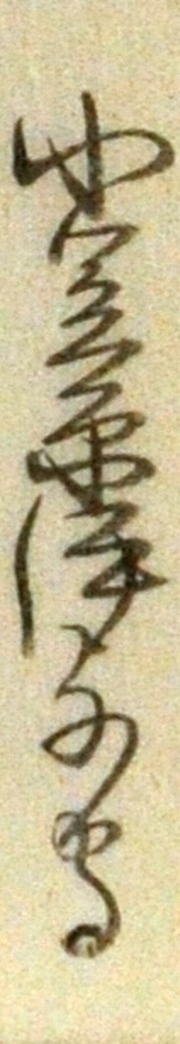小笠原伊与守
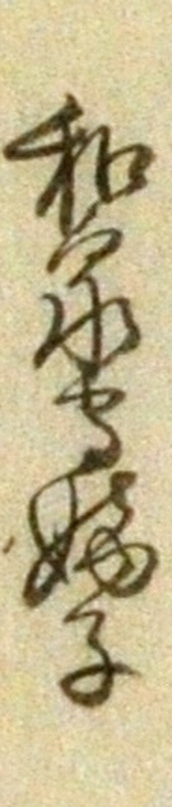和泉守嫡子
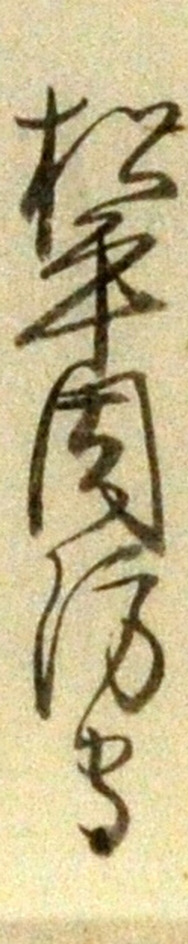松平周防守
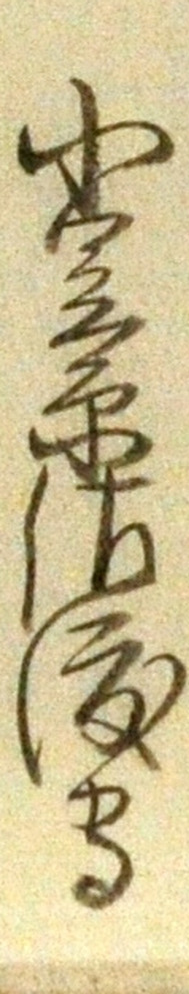煩小笠原佐渡守
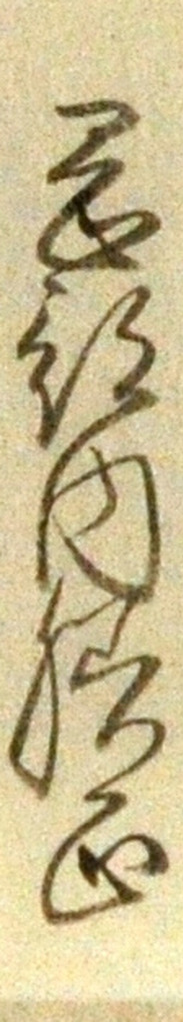岡部内膳正
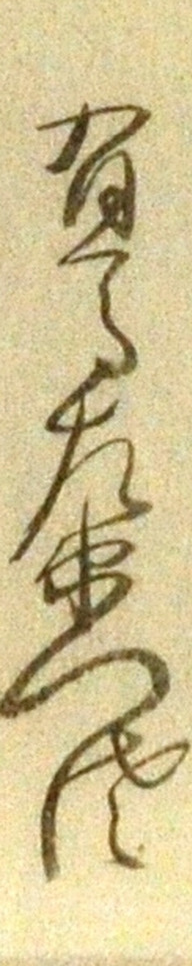煩有馬左衛門佐
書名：御馳走御能ノ節ノ留外
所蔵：伊那市立高遠町図書館・合同会社AMANE
